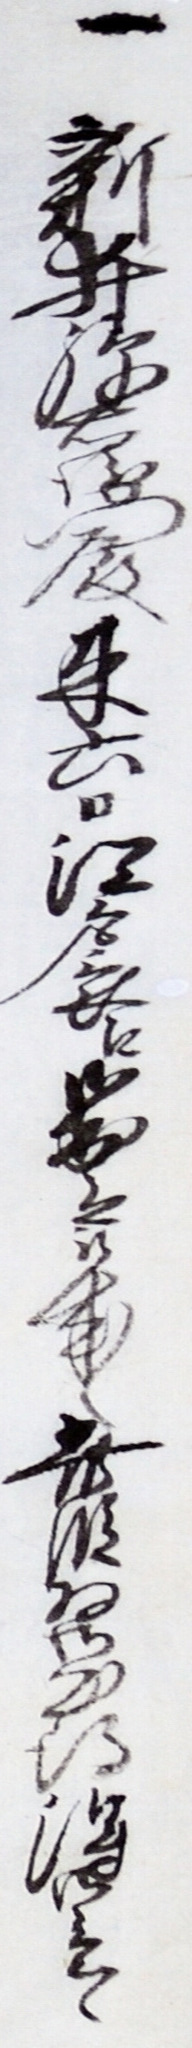一新井孫右衛門殿来六日江戸表江御出置被成候此段為御心得候ハバ
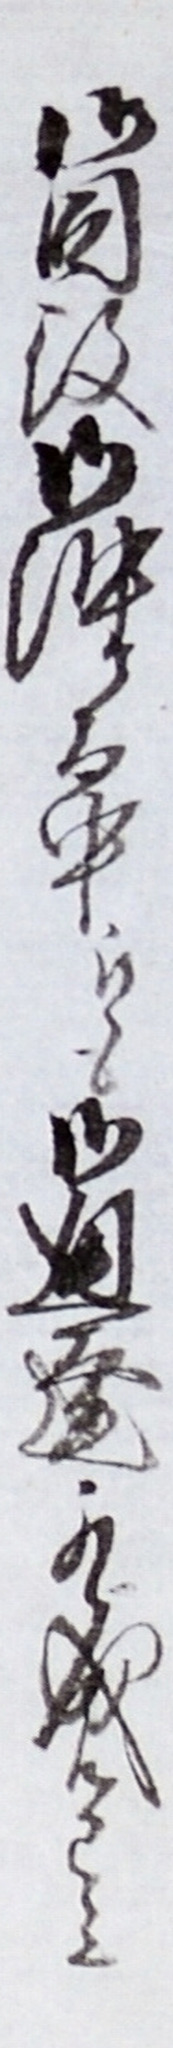御同役御油ニて中江も御通可成候已上
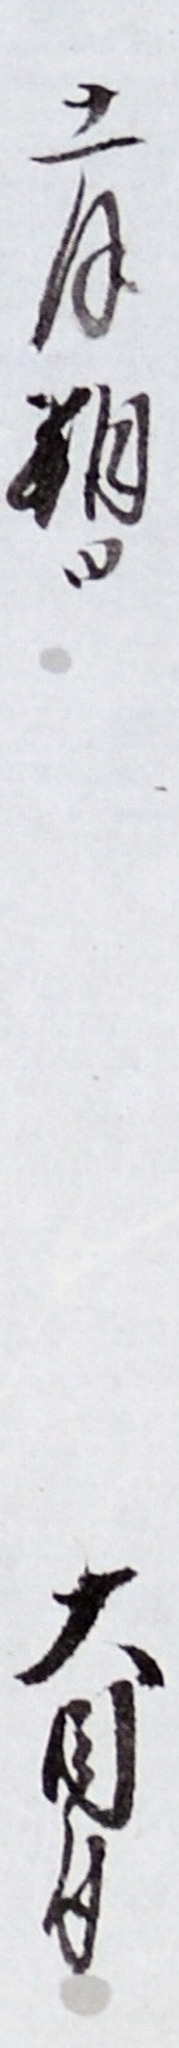十一月朔日大目付
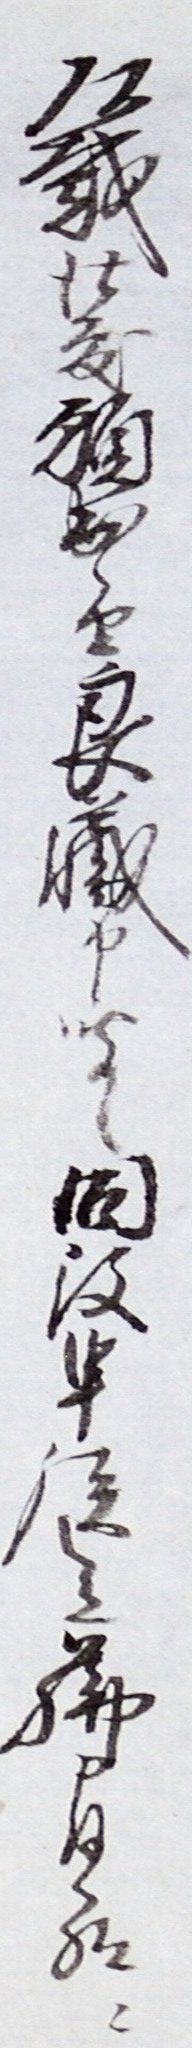頂戴仕度願出候由良蔵申聞候同役申談之上御払申候様ニ
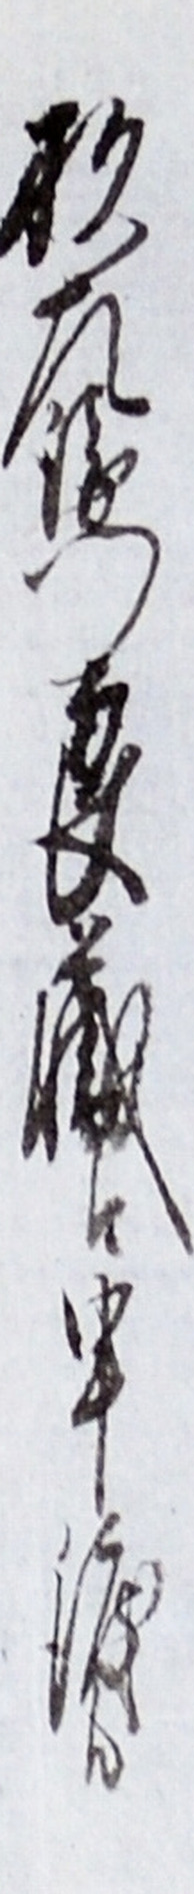杉左衛門良蔵江申渡候
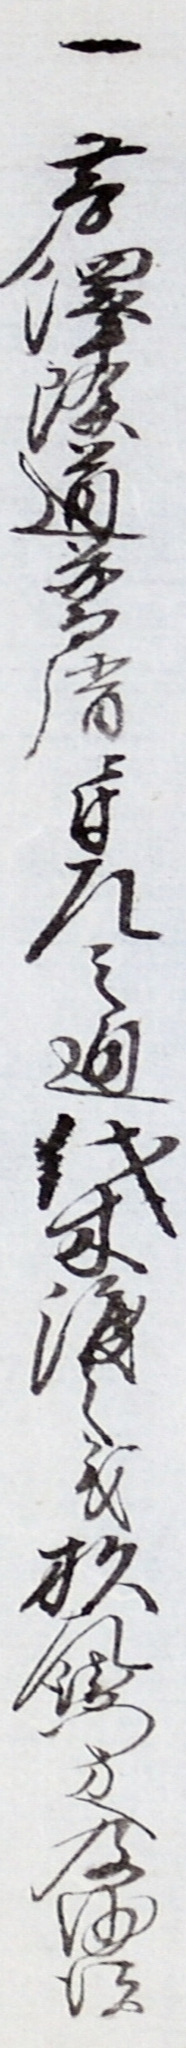一芦澤除道普請ニ付左之通代木之義杉左衛門も及沙汰
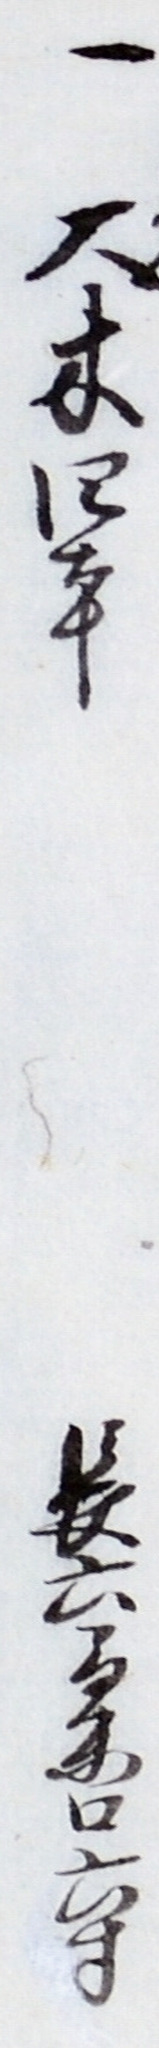一大木四本長六間余口六寸
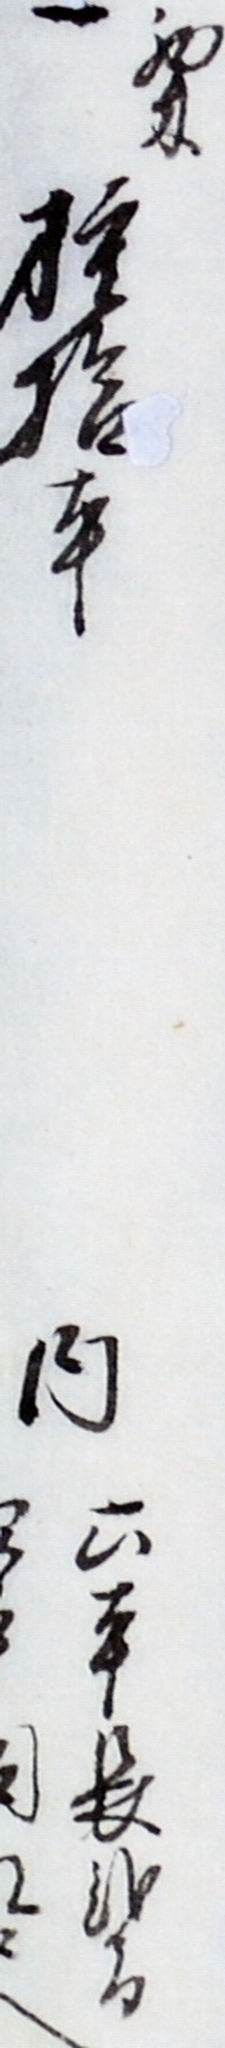一種拾本内六本長弐間
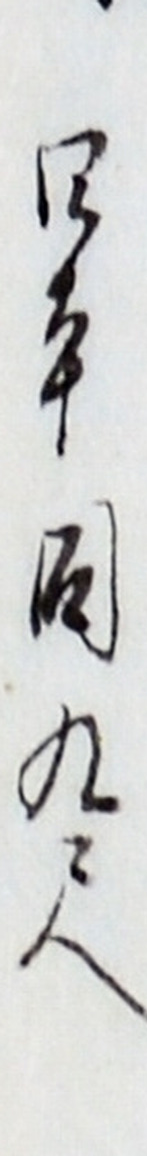四本同九尺
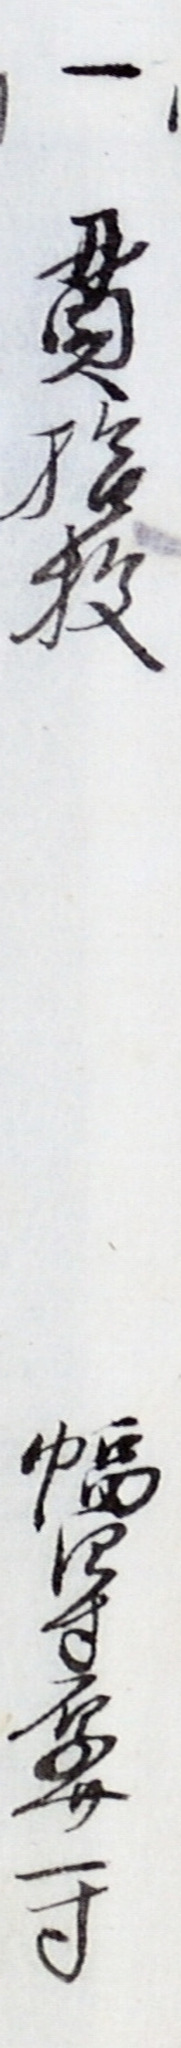一貫拾枚幅四寸厚サ一寸
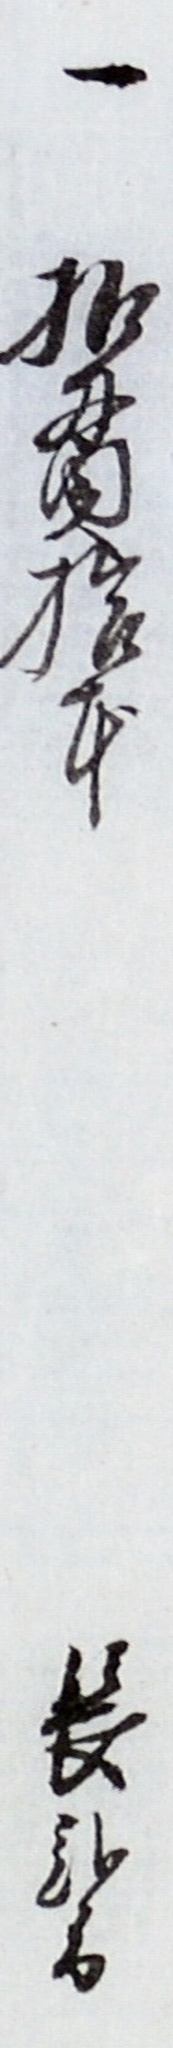一拾貫拾本長弐間
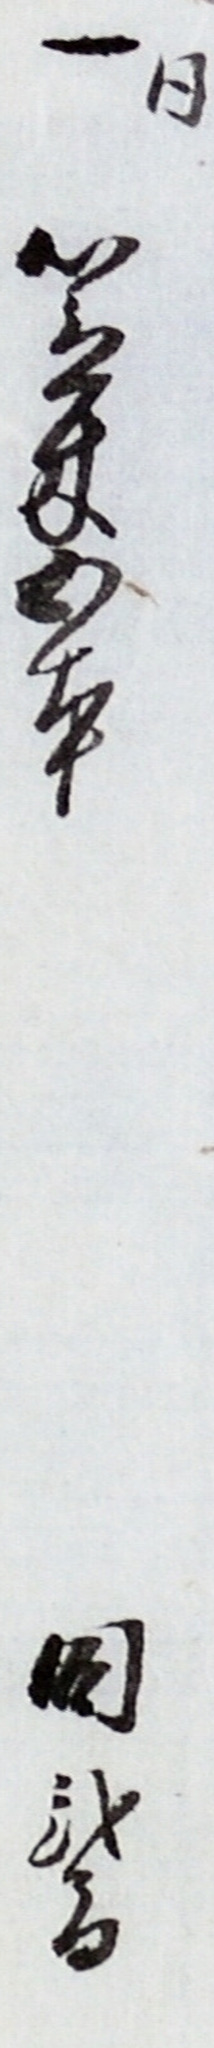一笠木五本同弐間
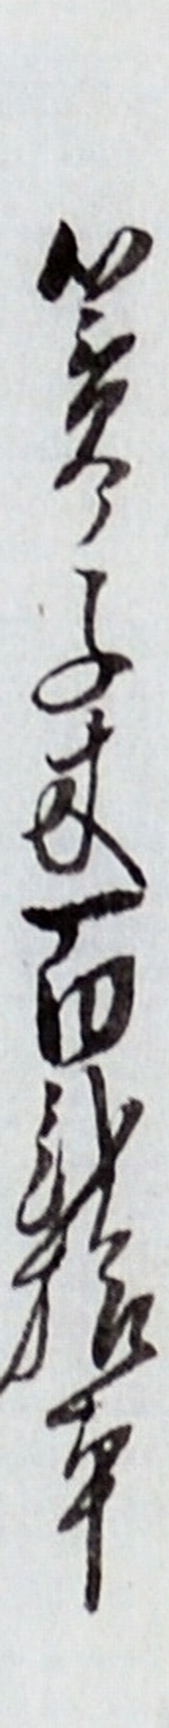一簀ノ子木百弐拾本
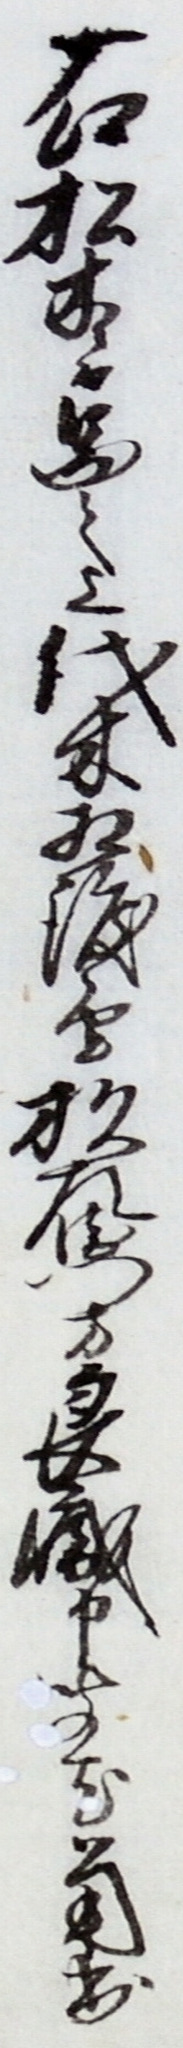右松木御図之上代木相渡候由杉左衛門方良蔵申聞尤用出
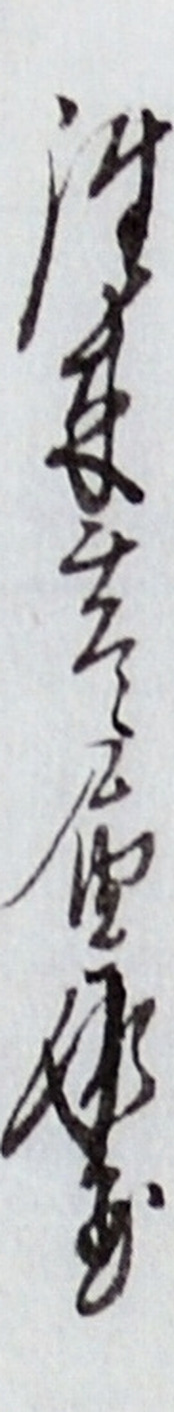往来先之届承置
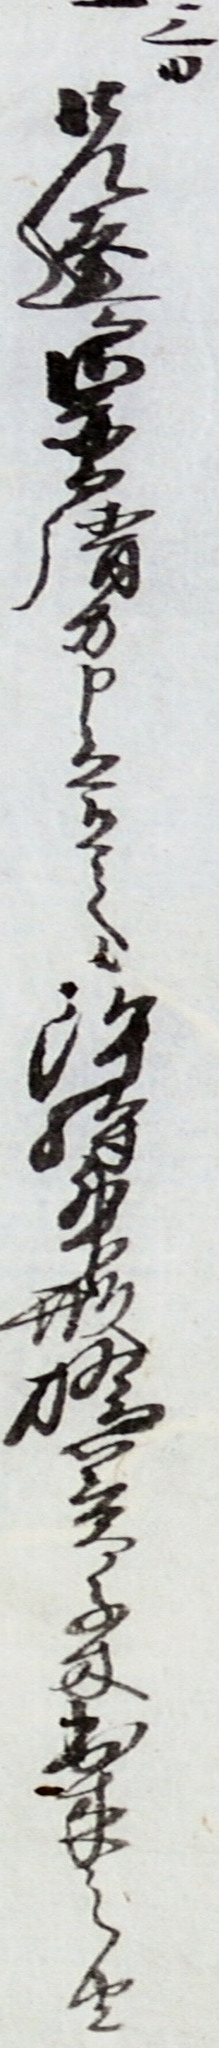一先達て御御普請方申立有之候鉾持升形橋簀ノ子出来之由
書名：御山奉行御用控
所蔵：伊那市立高遠町図書館・合同会社AMANE
